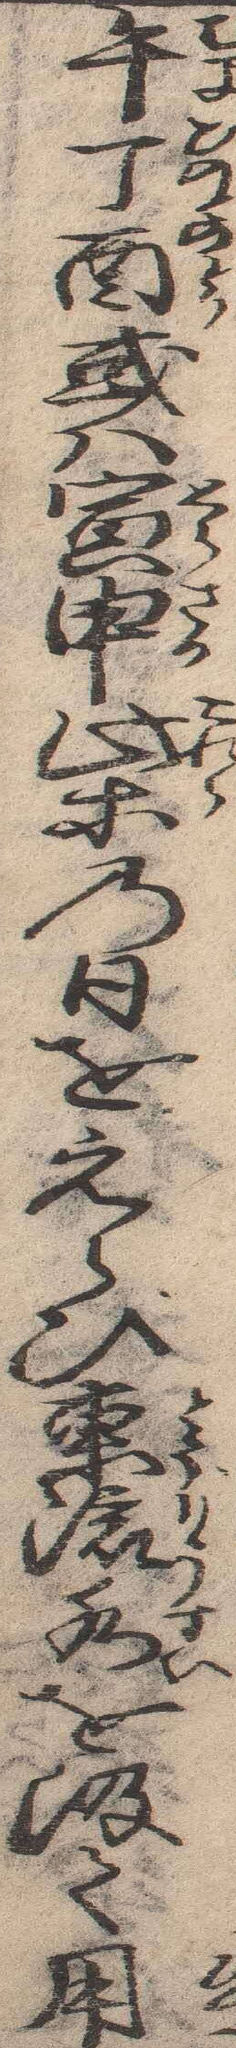午丁酉或は寅申此等の日をえらび東流水を汲て用

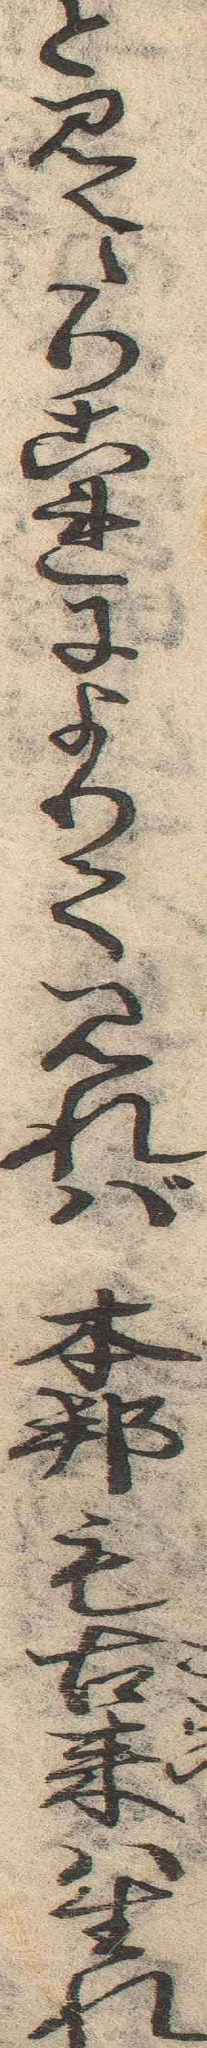と見えたりこれによりて見れば本邦も古来は生れ
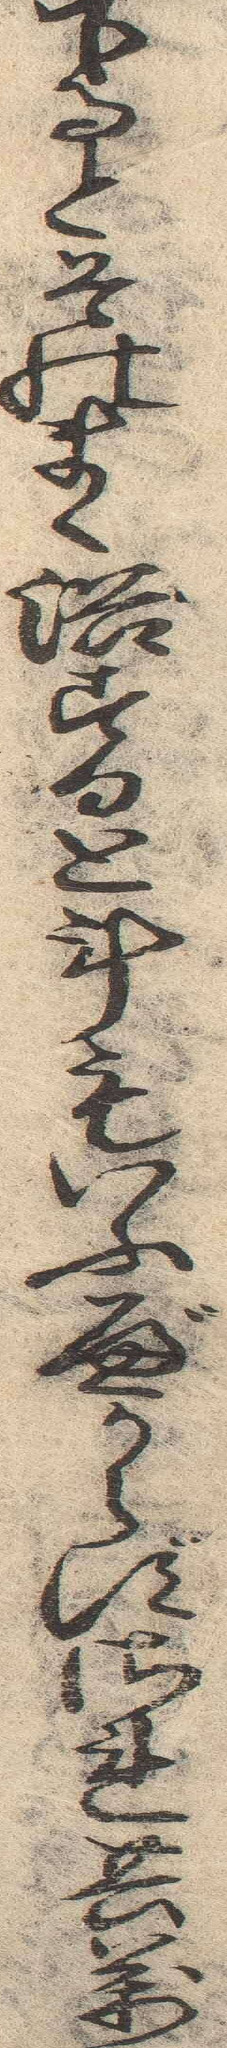下るとそのまゝ浴すると斗もいふべからずされ共萬
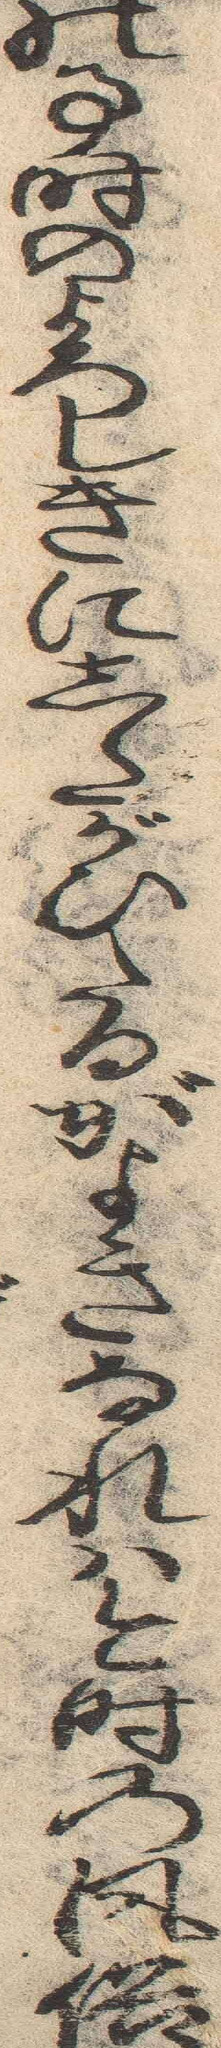の事時のよろしきにしたがひたるがよきなれはと時の風俗
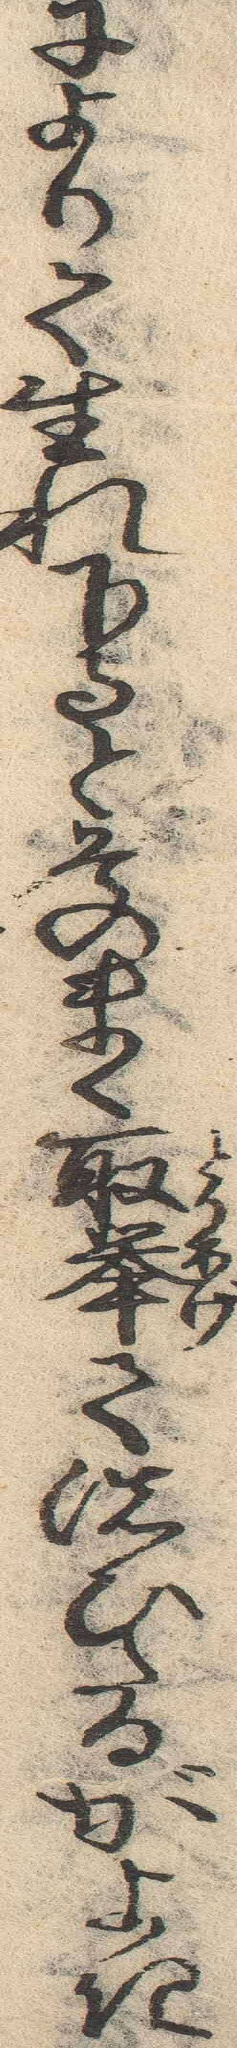によりて生れ下るとそのまゝ取挙て洗ひたるがよき
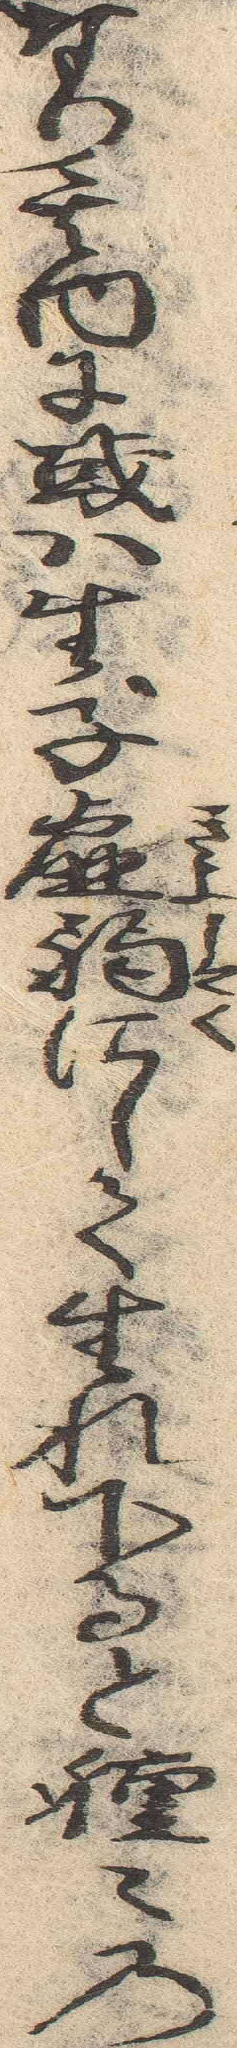なり其内に或は生子虚弱にして生れ下ると種々の
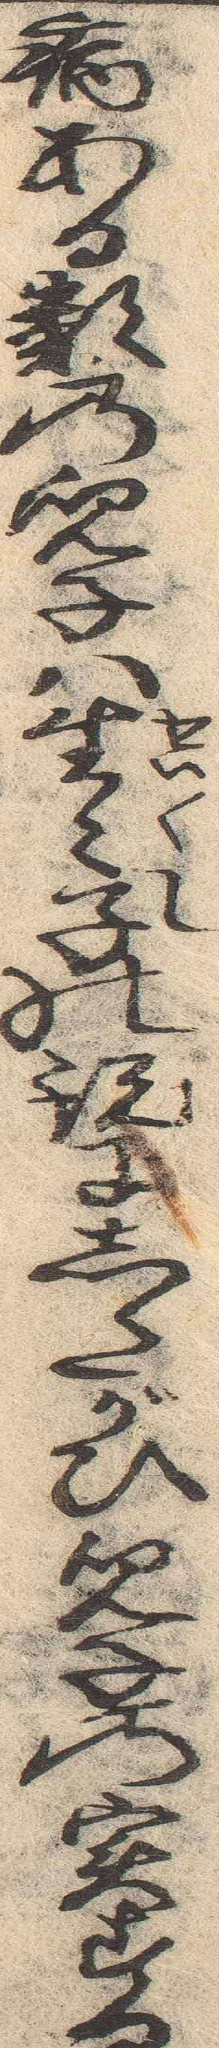病ある類の児子は生〻子の説にしたがひ児子の実する
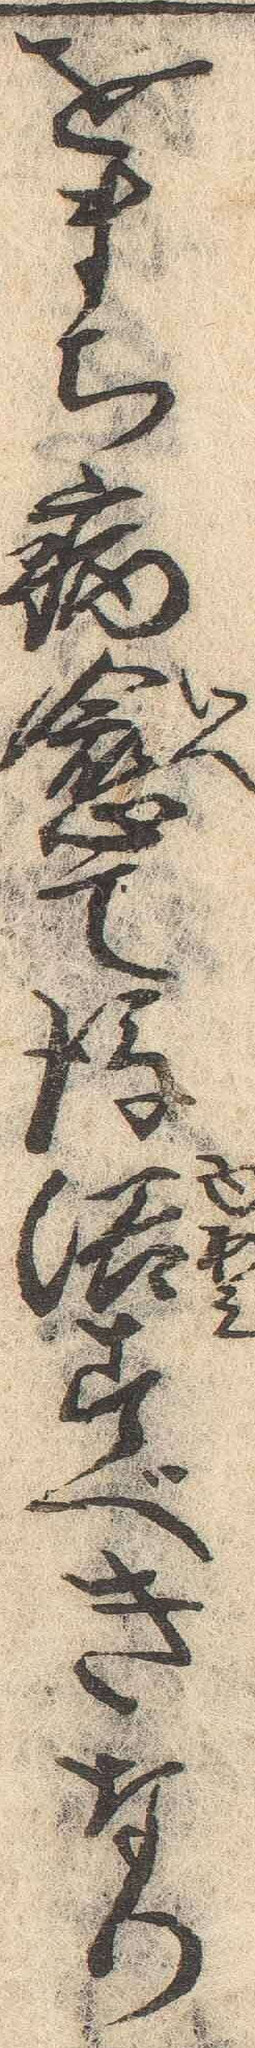をまち病愈て後浴すべきなり
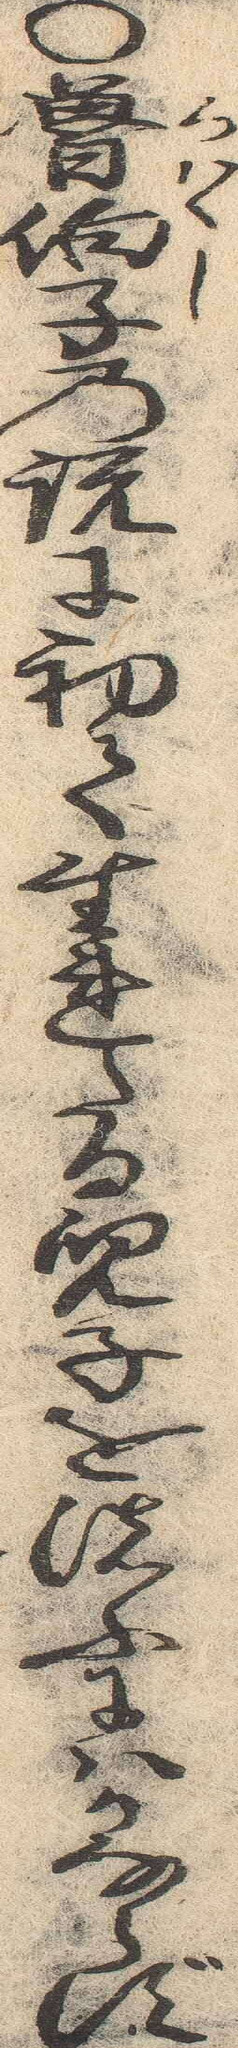◯魯伯子の説に初て生れたる児子を洗ふにはかならず
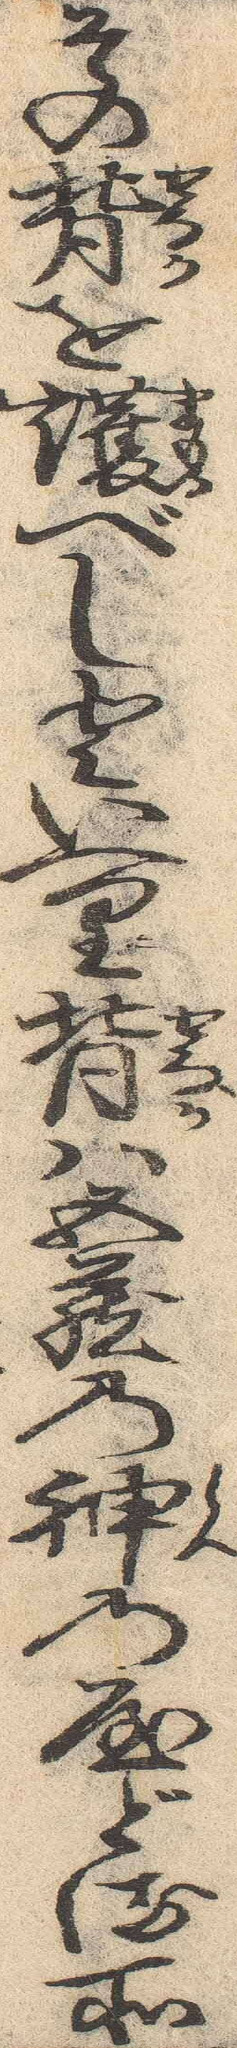その背を護べしといへり背は五藏の神のやどる所
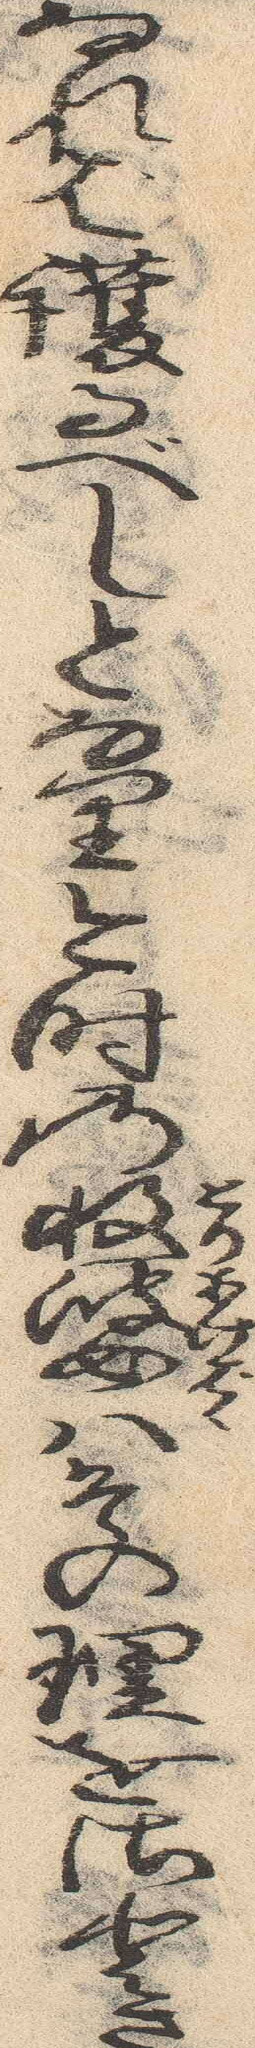なれば護るべしとなり今時の収婆はその理をさとさ
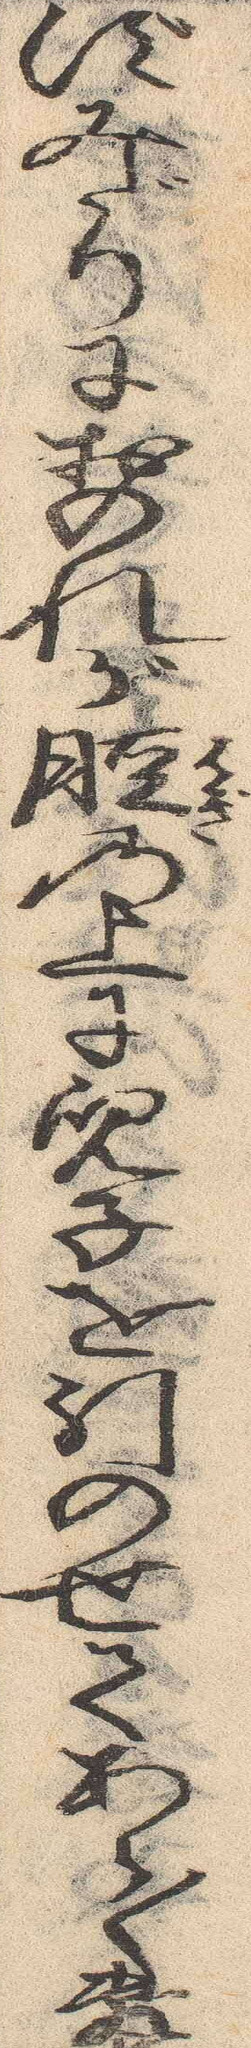ずみだりにおのれが脛の上に児子を引のせてあら〳〵敷
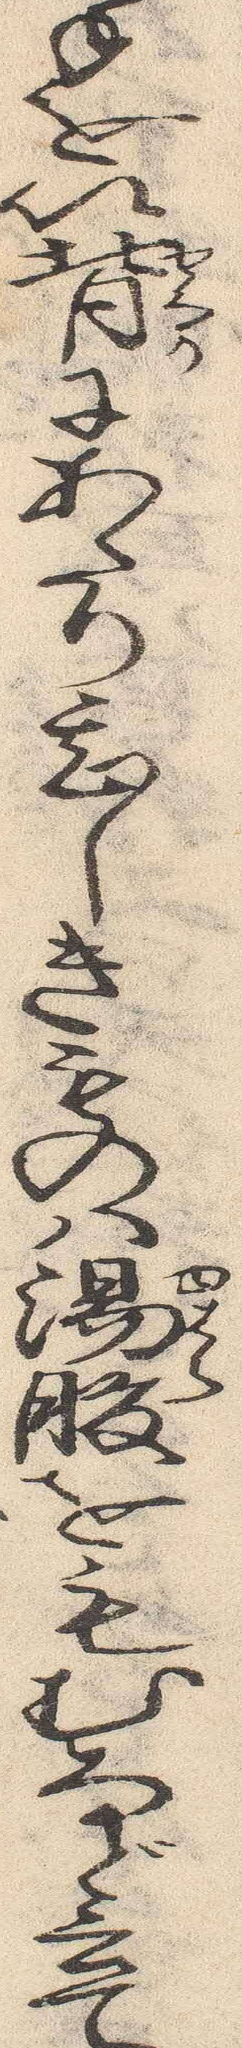手を以背にあたり甚しきものは湯腹をもむなどと云て
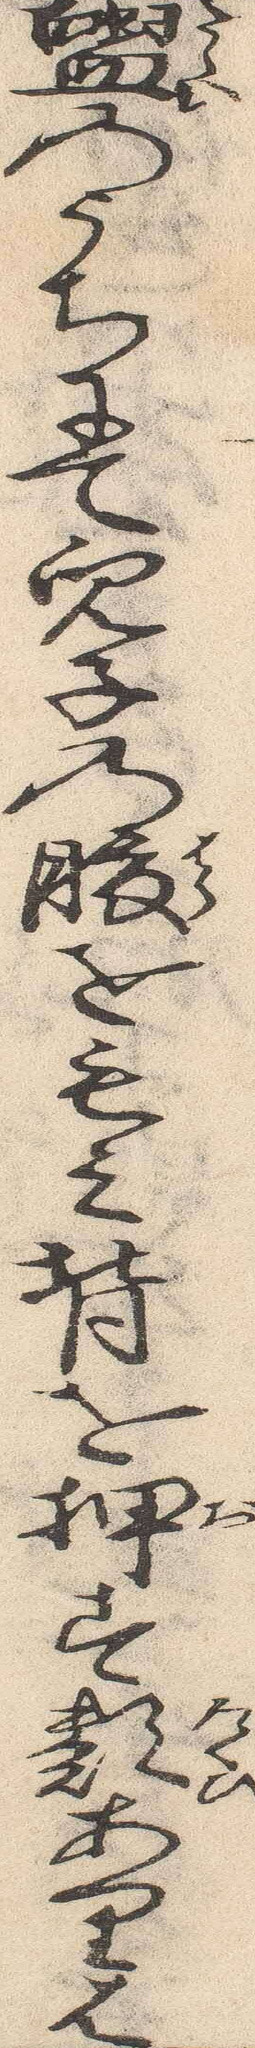盥のうちにて児子の腹をもみ背を押す類ありは
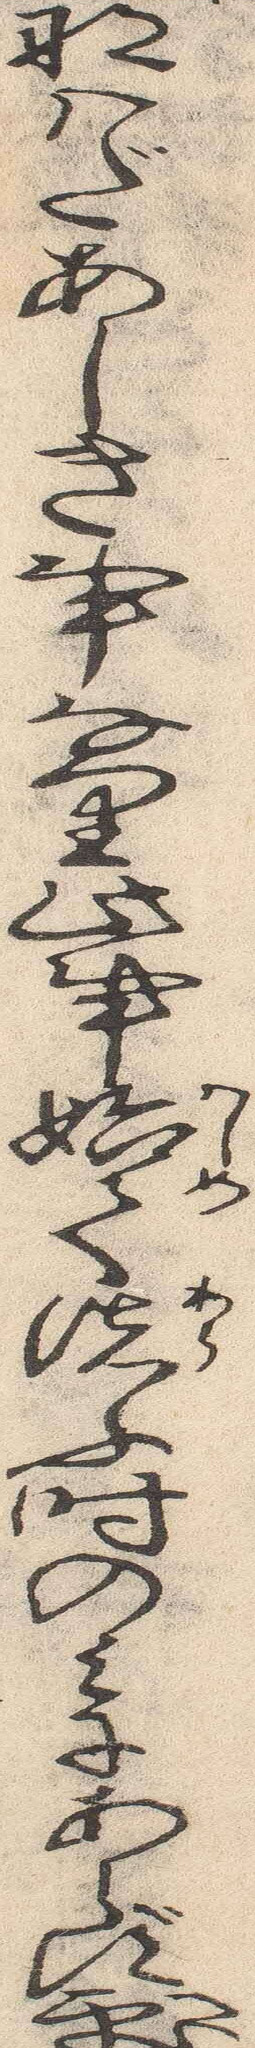なはだあしき事なり此事始て洗ふ時のみにあらず平
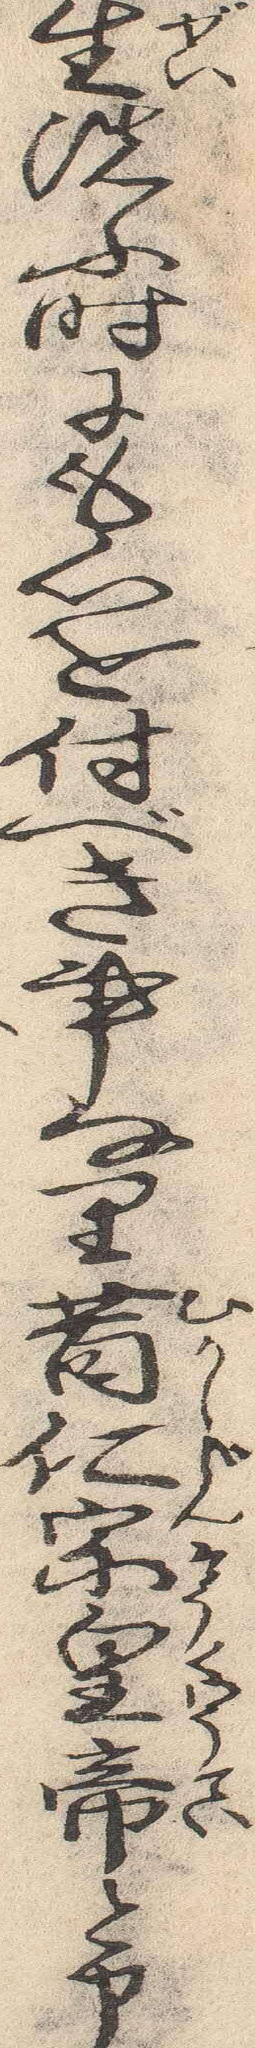生洗ふ時にも心を付べき事なり昔仁宗皇帝と申
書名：小児必用養育草
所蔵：東京学芸大学附属図書館 国文学研究資料館
